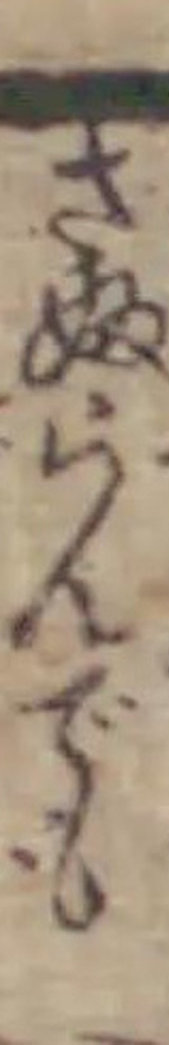さふらんでも
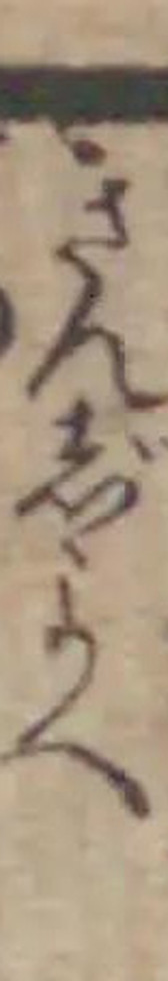きんじよへ
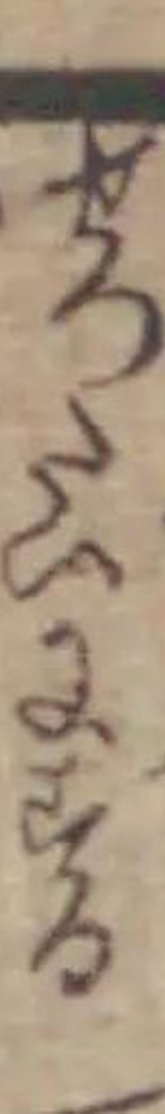せつたいにする
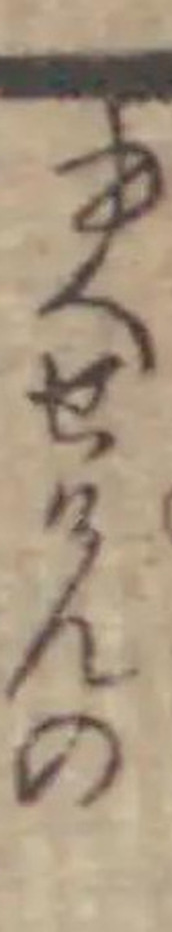ゆへせけんの
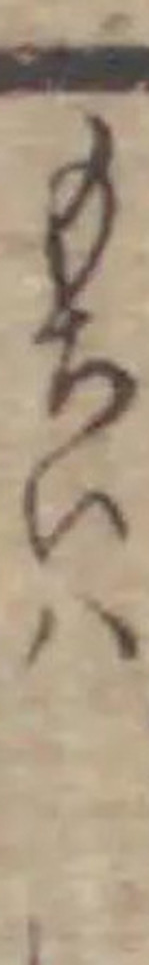もちいは
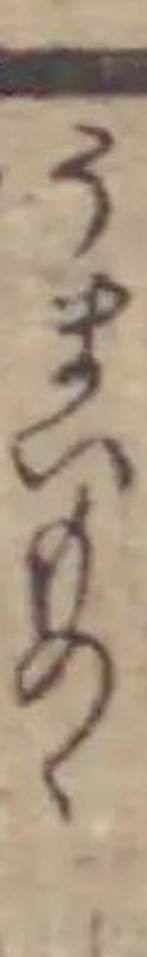うまいものゝ
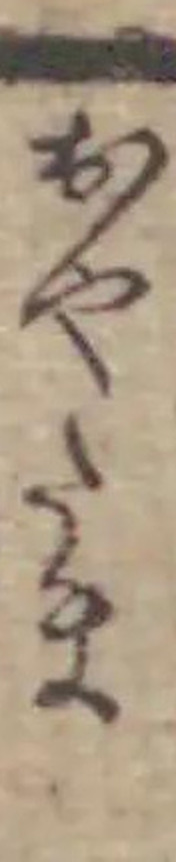おやたま

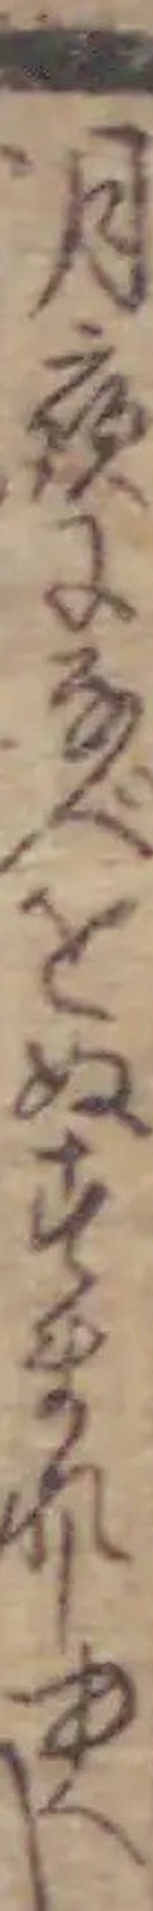月夜になべをぬすまれしゆへ
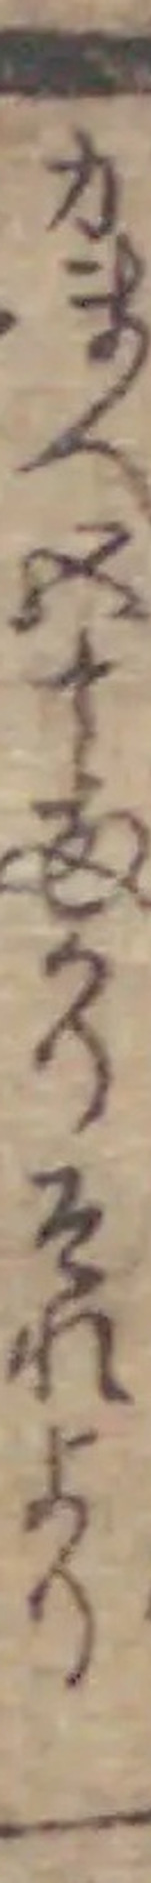かまへ五十両かりそれより
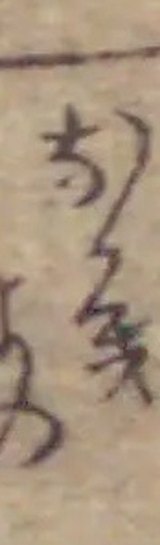なかき
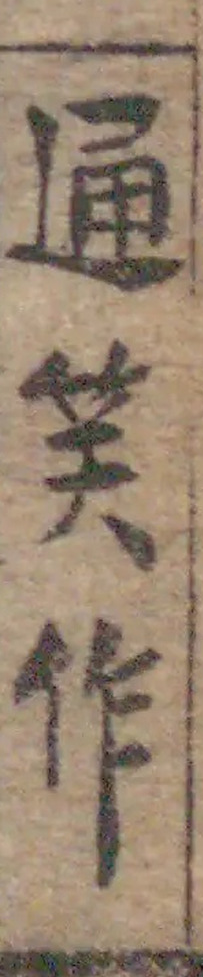通笑作
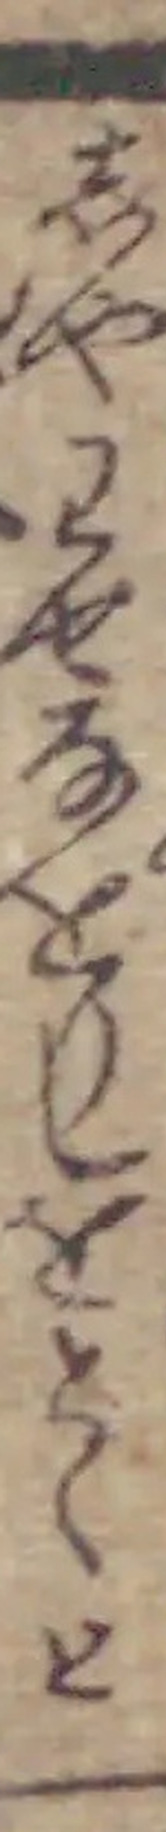しやわせなをりしをとくと
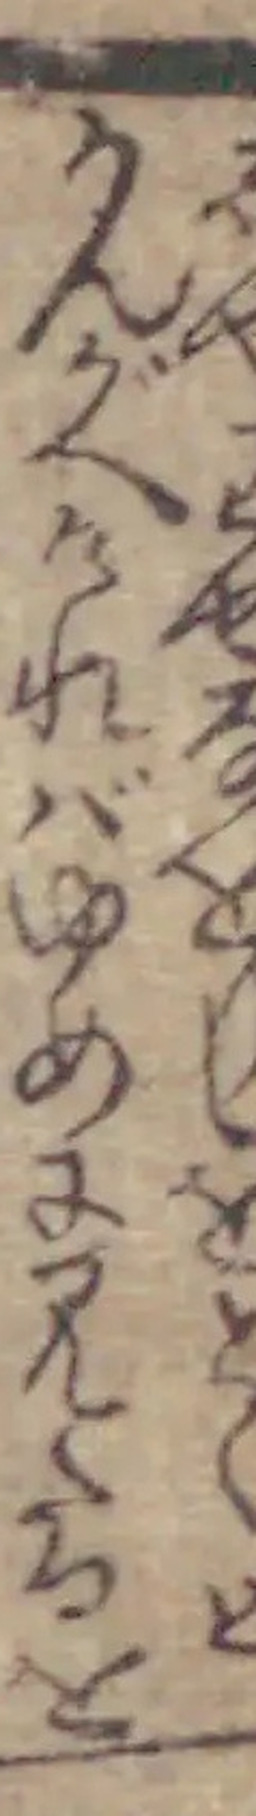かんがへければゆめに見たるを
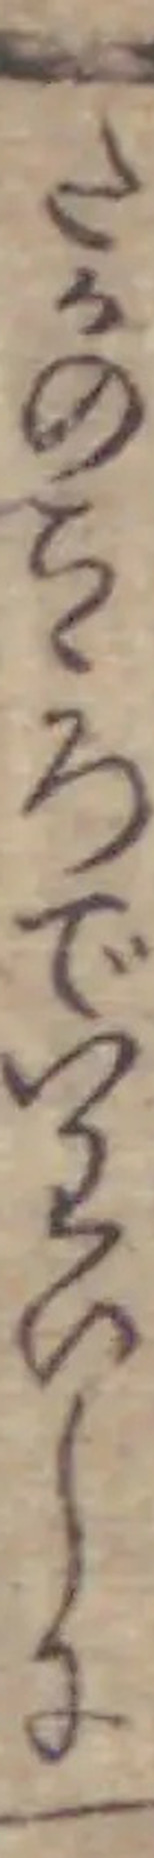たかのこゝろでいわいしに
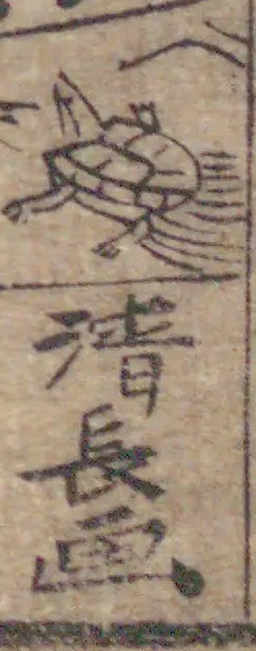清長画
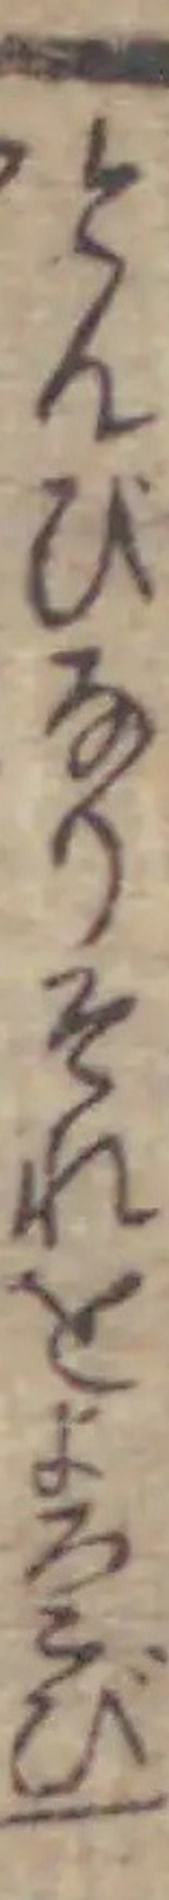とんびなりそれをよろこび
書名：間違月夜鍋 2巻
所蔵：国立国会図書館 National Diet Library, JAPAN
